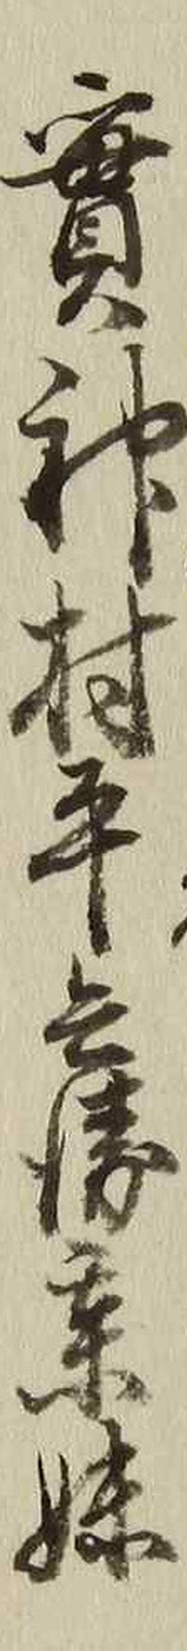実神村平兵衛某妹
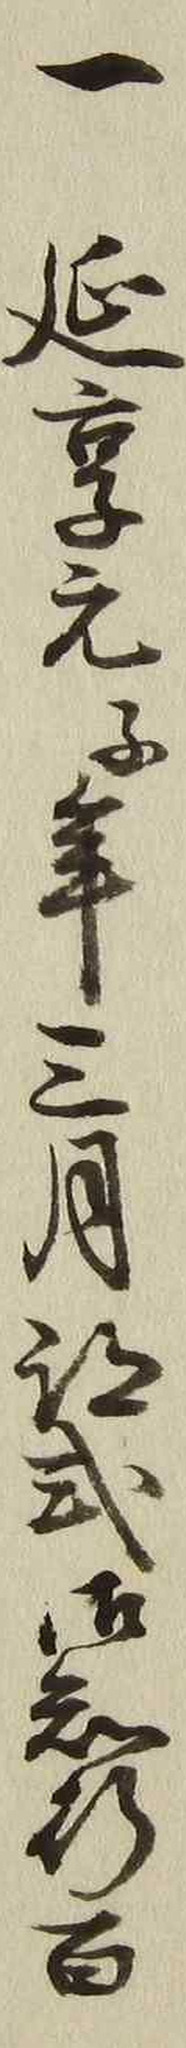一延享元子年三月跡式御知行百
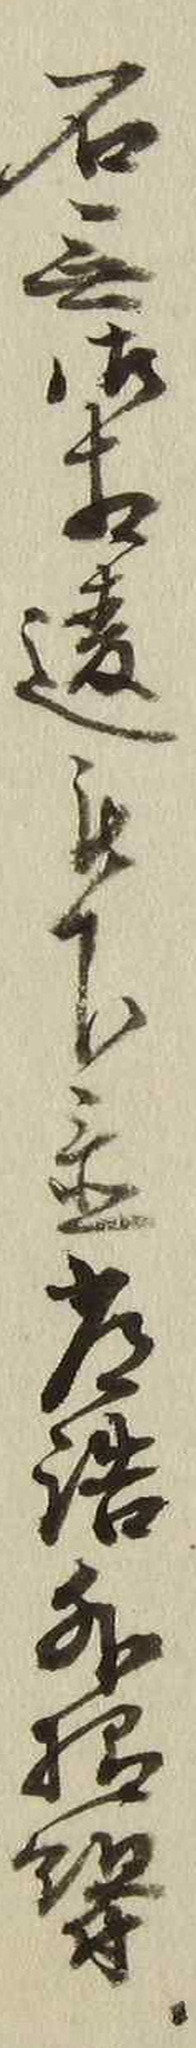石無御相違被下置常詰外様組付
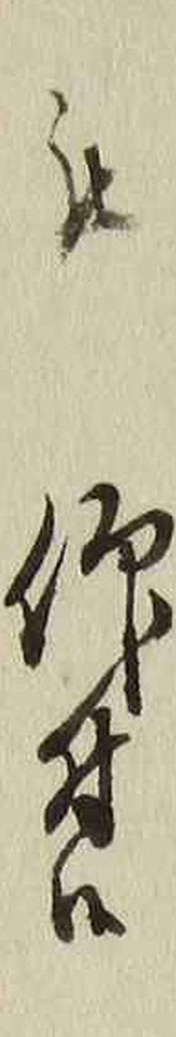被仰付候
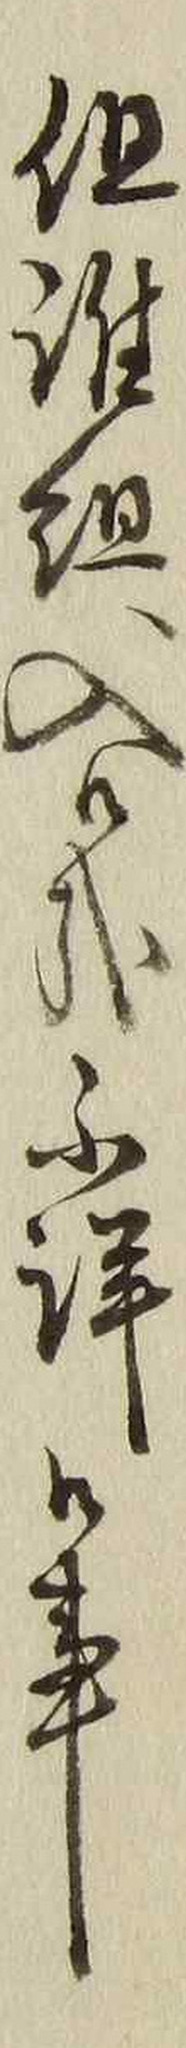但誰組へ入候哉不詳候事
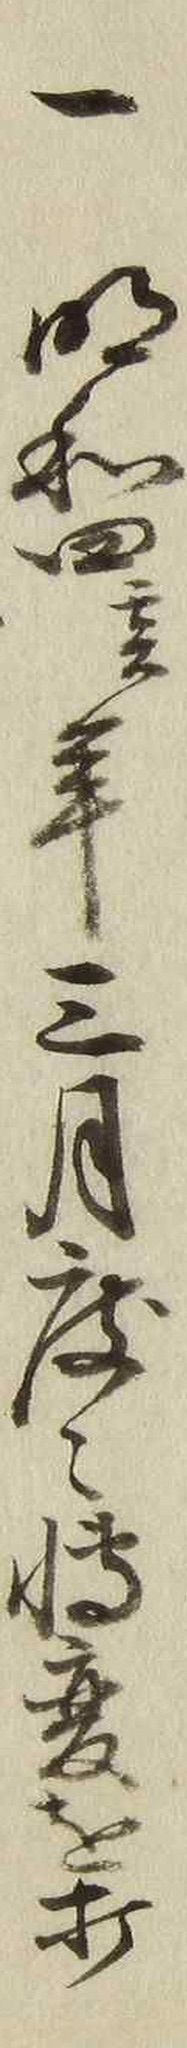一明和四亥三月度々転変を打
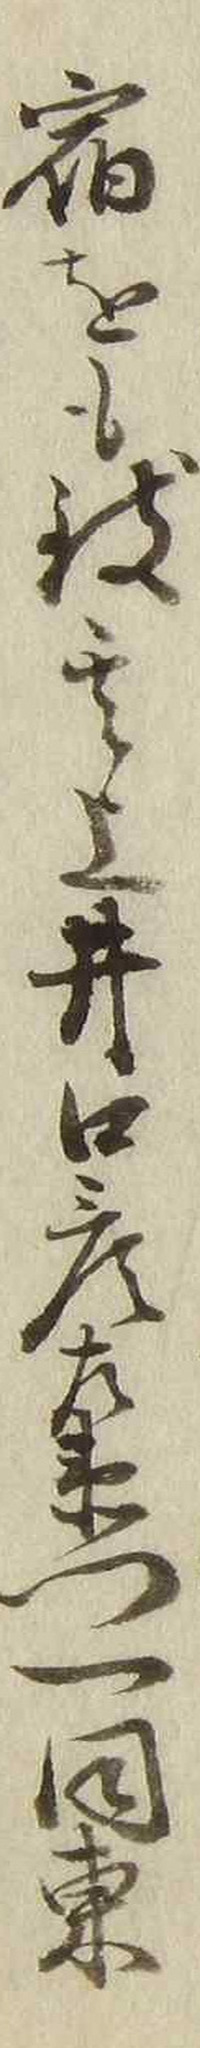宿をも致其上井口彦左衛門一同東
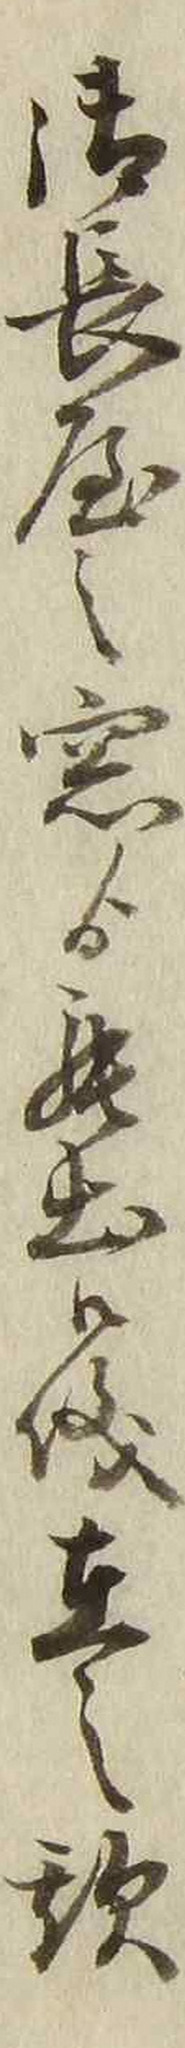御長屋之窓ゟ罷出候儀在之煩

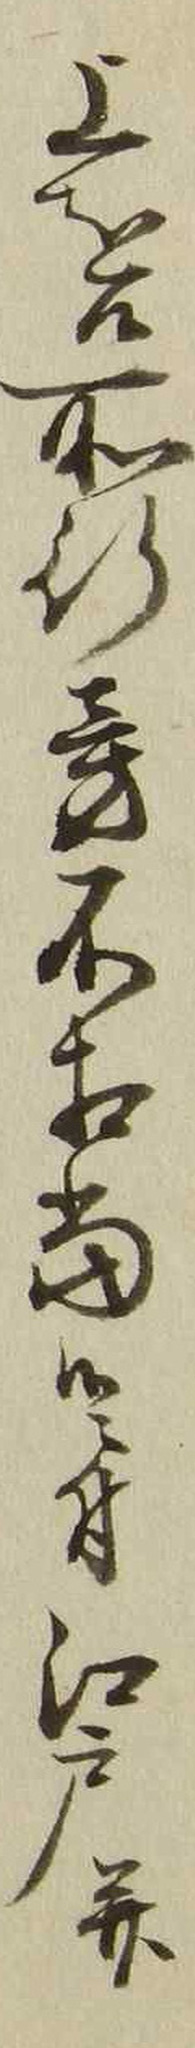上を以所行旁不相当候ニ付江戸并
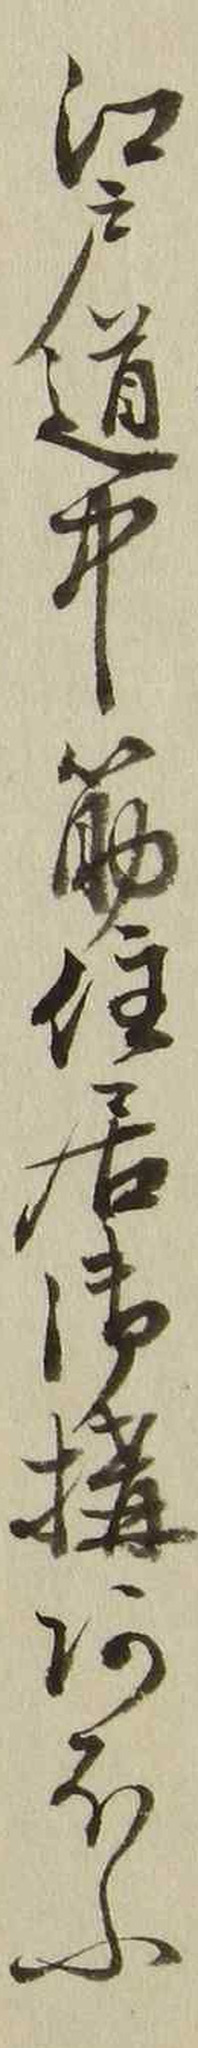江戸道中筋住居御構あほふ
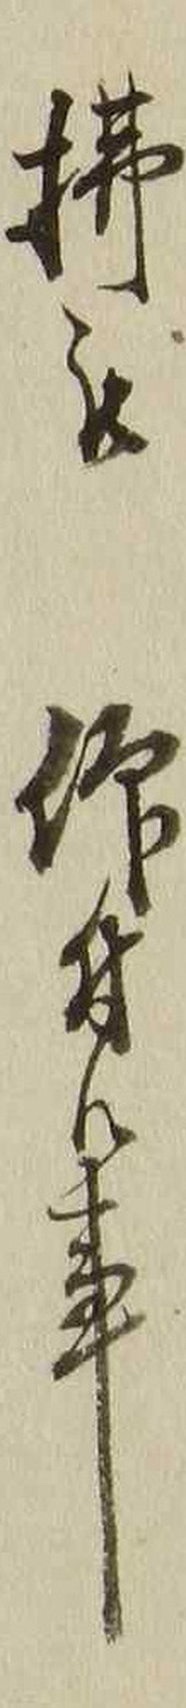払被仰付候事
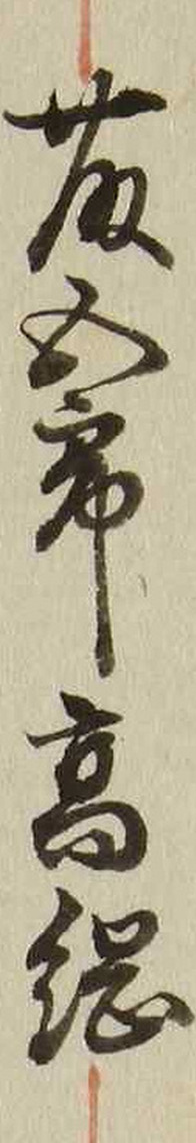藤五郎高綱
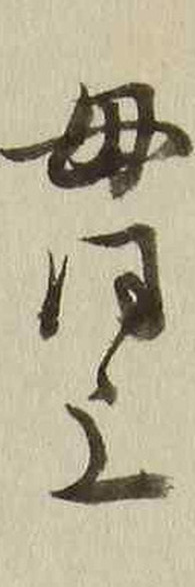母同上
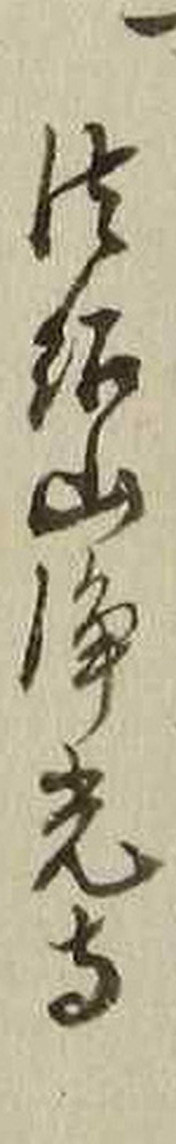法紹山浄光寺
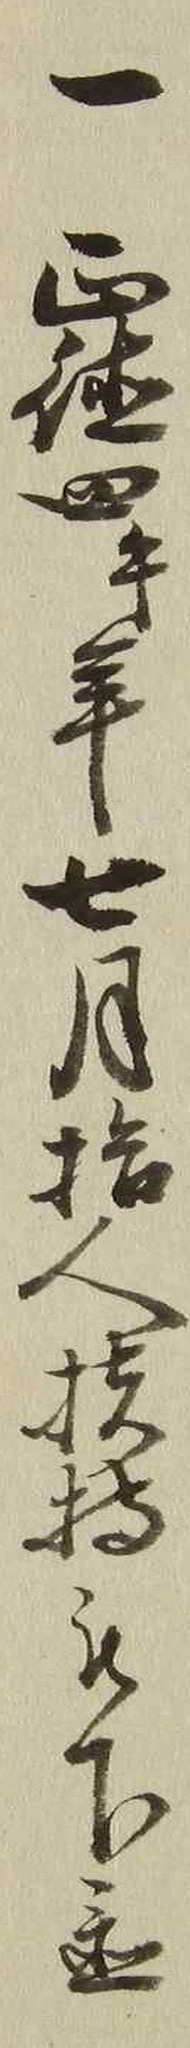一正徳四午年七月拾人扶持被下置
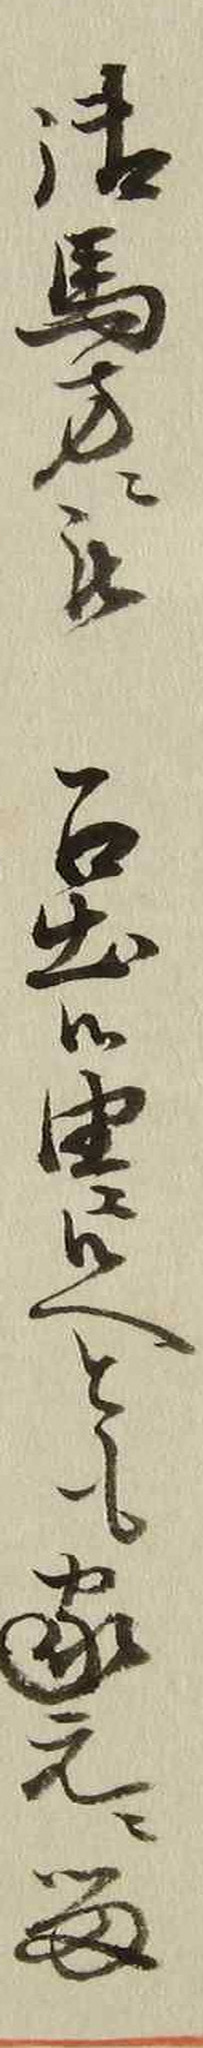御馬方ニ被召出候由ニ候へとも家元ニ留
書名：諸士系譜　巻之31　い之部31
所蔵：会津若松市立会津図書館
